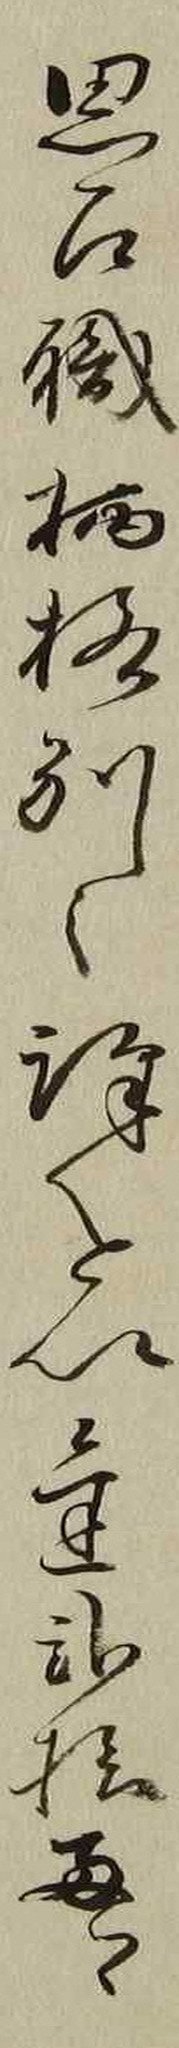思召職柄格別之許を以金弐拾両ツヽ
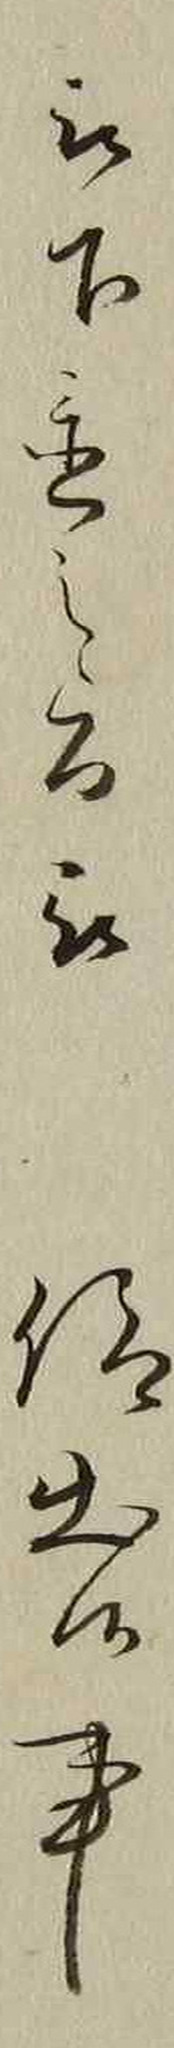被下置之旨被仰出候事
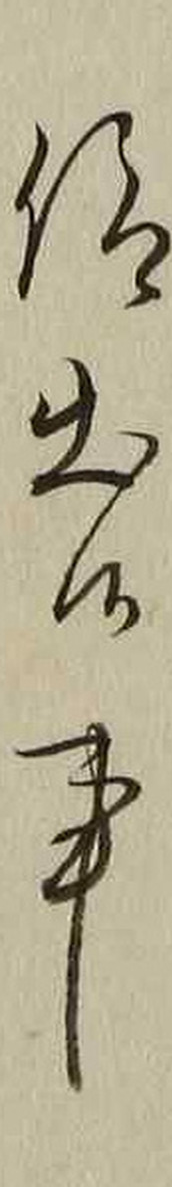仰出候事
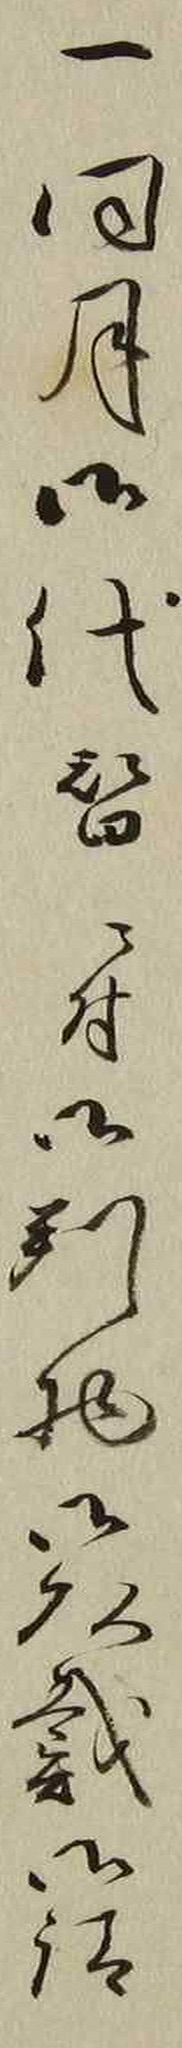一同月御代替ニ付御判物御頂戴御請
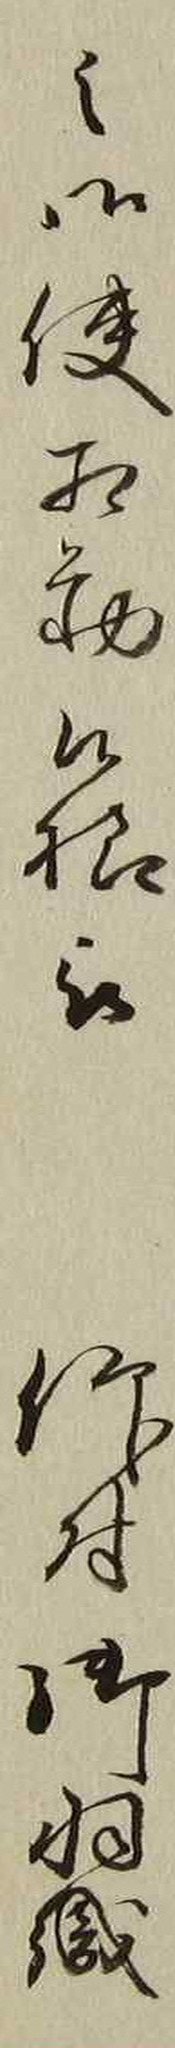之御使相勤候様被仰付御羽織
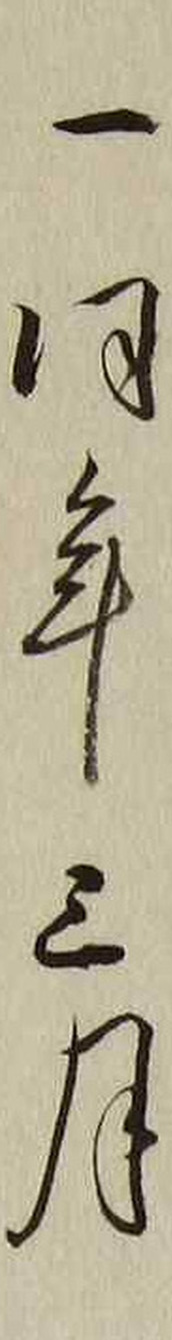一同年三月
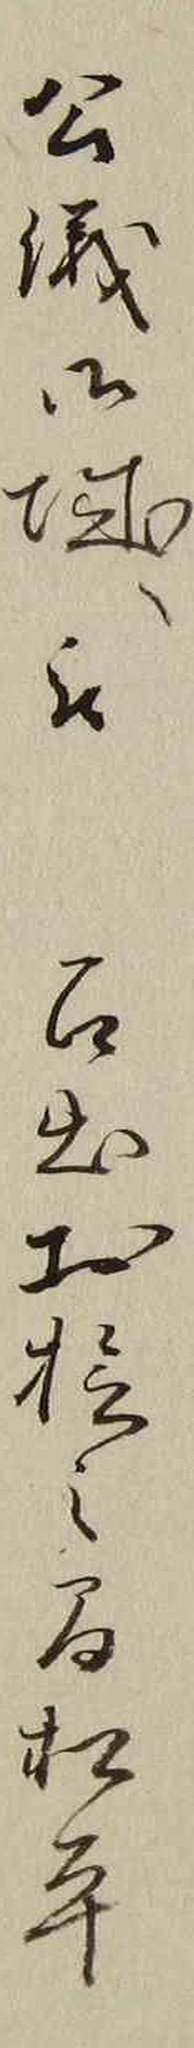公儀御城へ被召出於桧之間松平
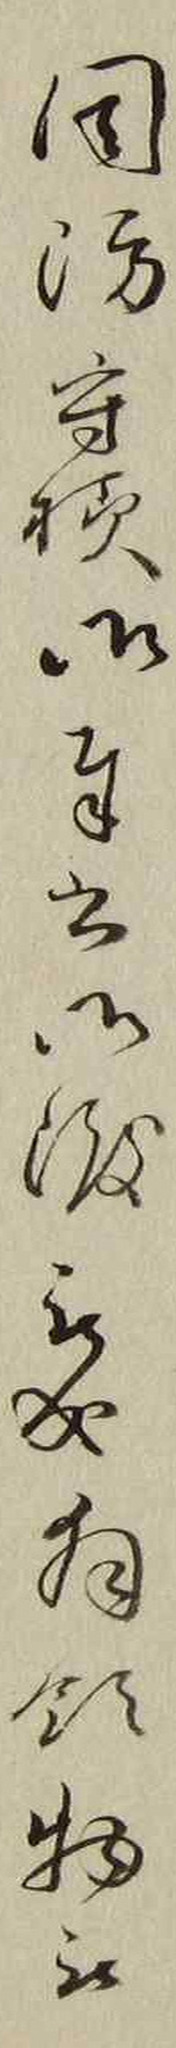周防守様御奉書御渡被成拝領物被
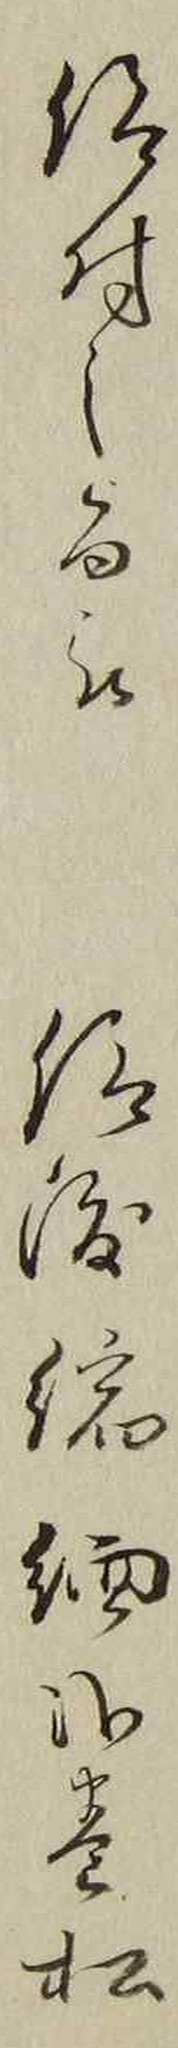仰付之旨被仰渡縮緬弐巻松
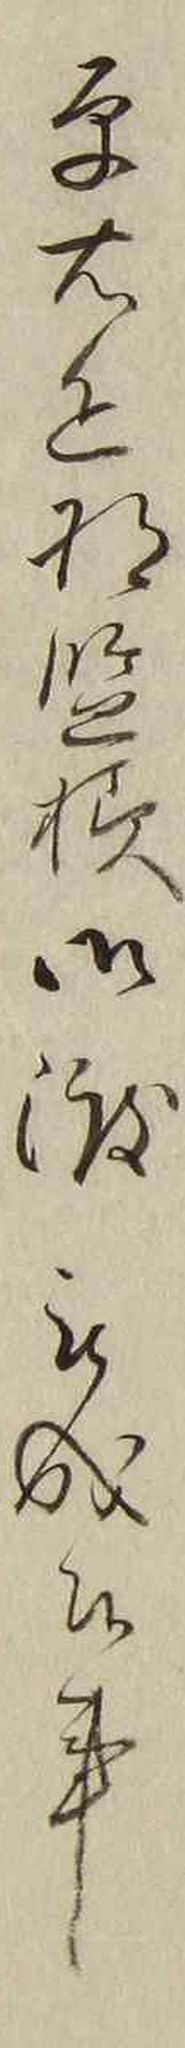原右近将監様御渡被成候事

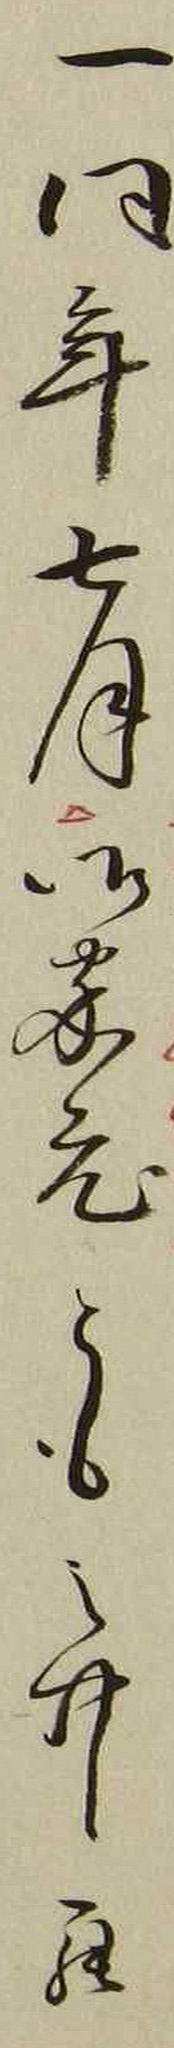一同年七月▵御家老とも之中罷
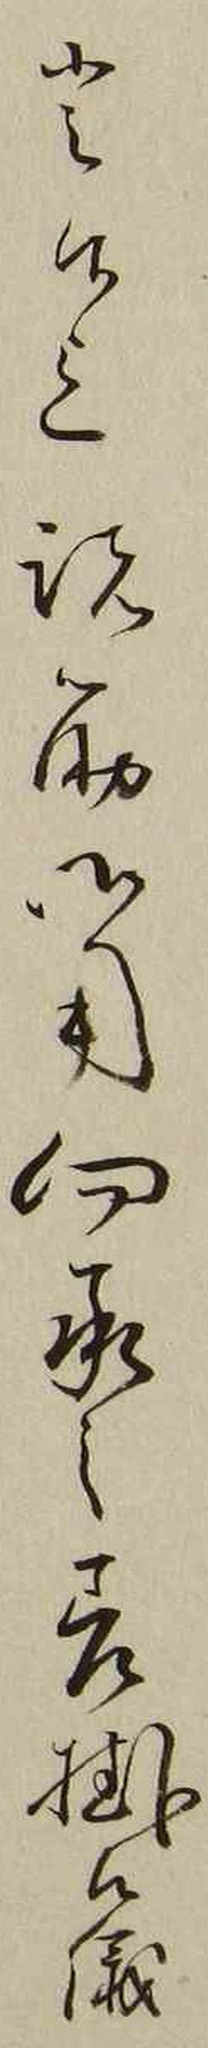登候迄諸筋御用向承之差掛候儀
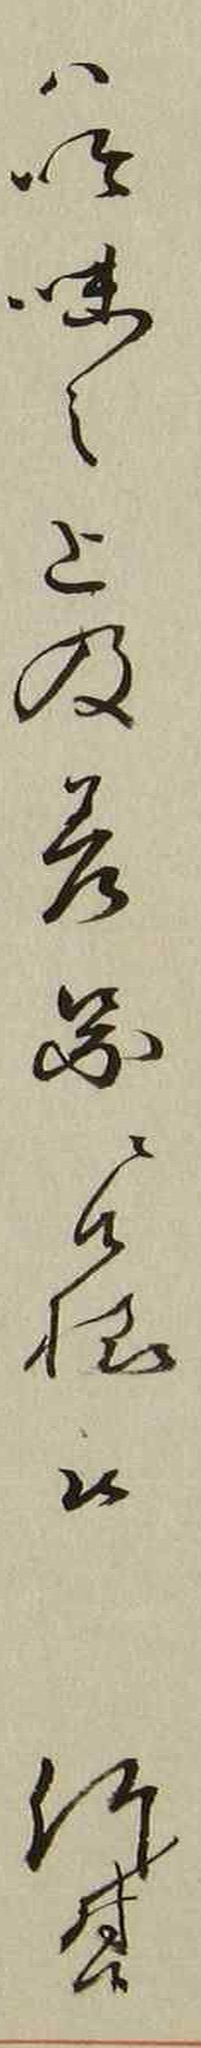ハ吟味之上及差図ニ候様被仰付候
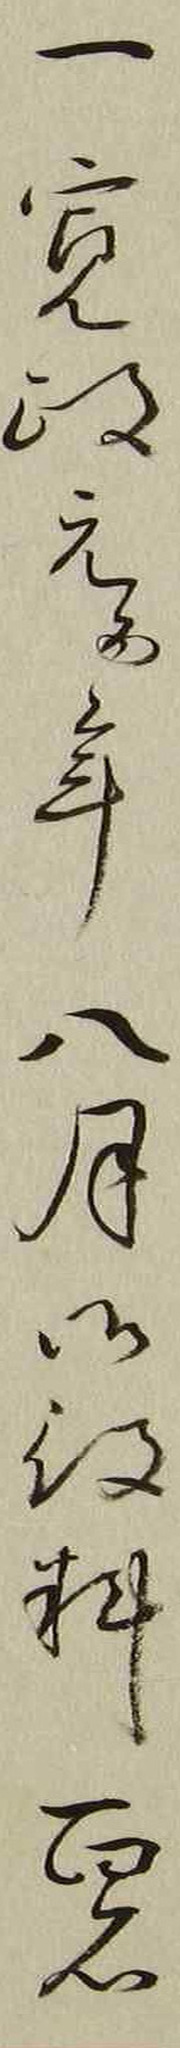一寛政元酉年八月御役料百石
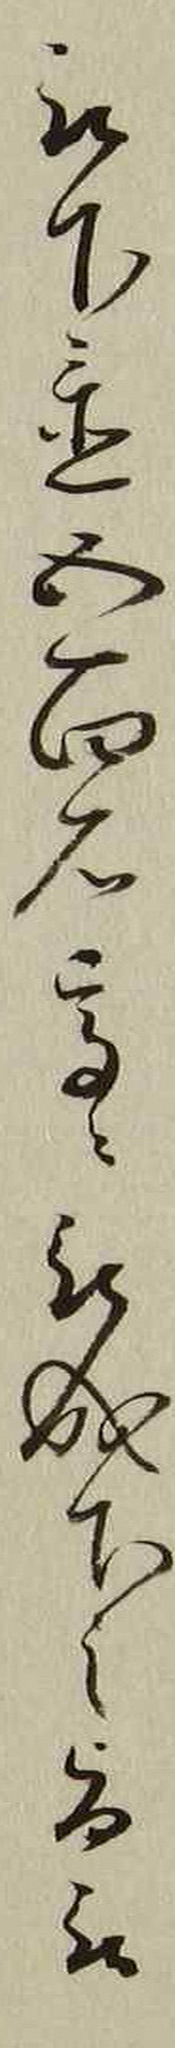被下置五百石高ニ被成下之旨被
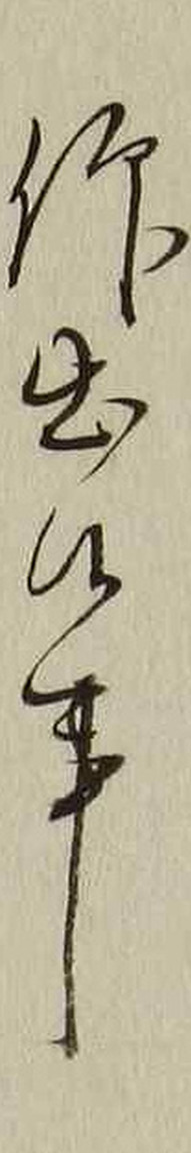仰出候事
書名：諸士系譜　巻之2　い之部2
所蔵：会津若松市立会津図書館
